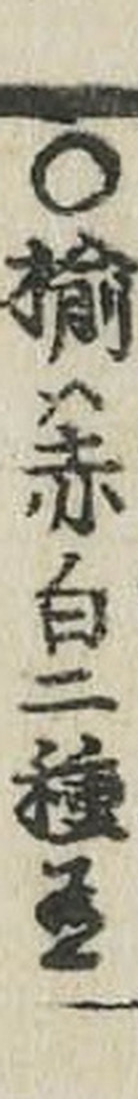○楡は赤白二種有
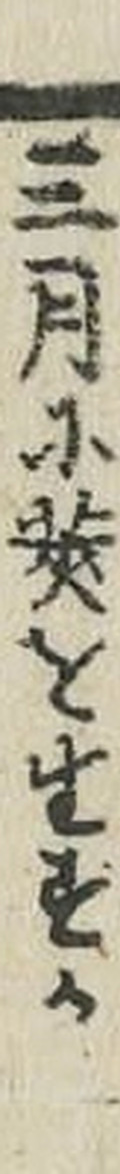三月に莢を生すか
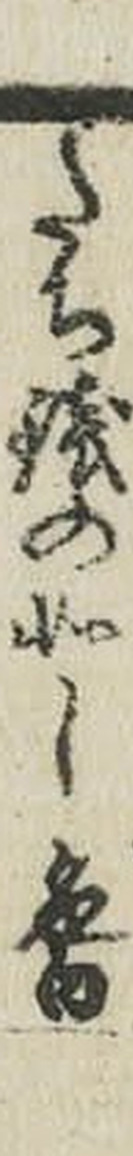たち銭の如し色白
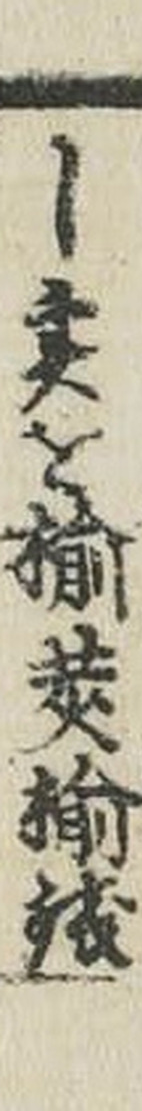し実を楡莢楡銭
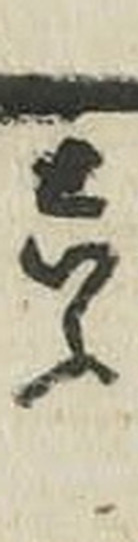といふ
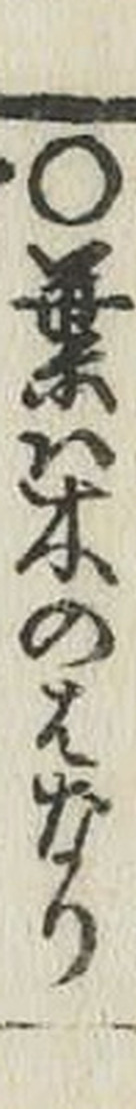○葉は木のはなり
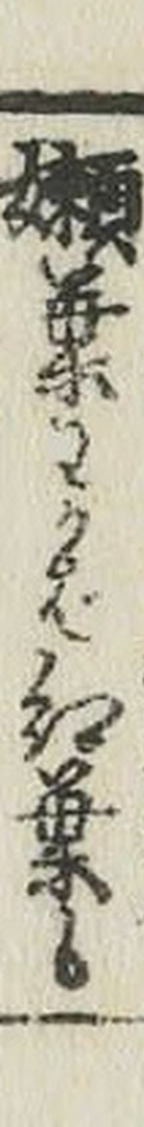嫰葉わかば紅葉も
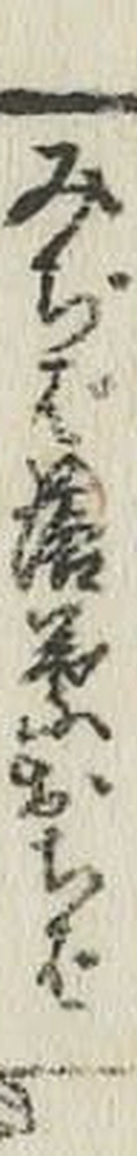みぢば落葉おちば
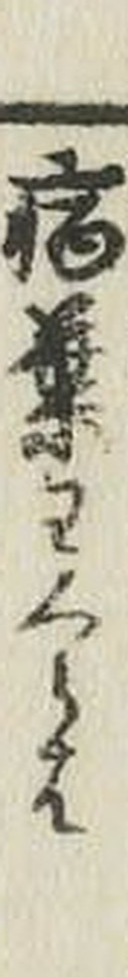病葉わくらは
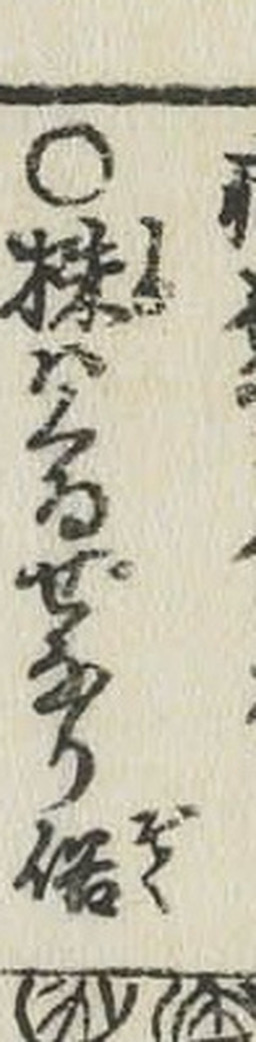○株はくるぜなり俗
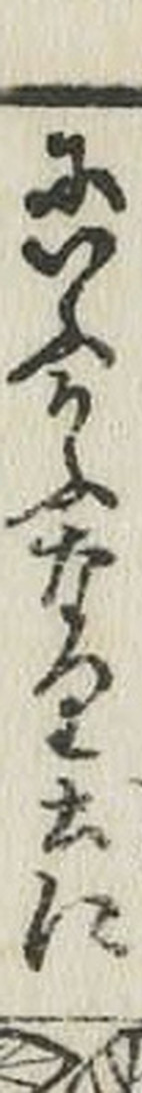にいふかふなり土に
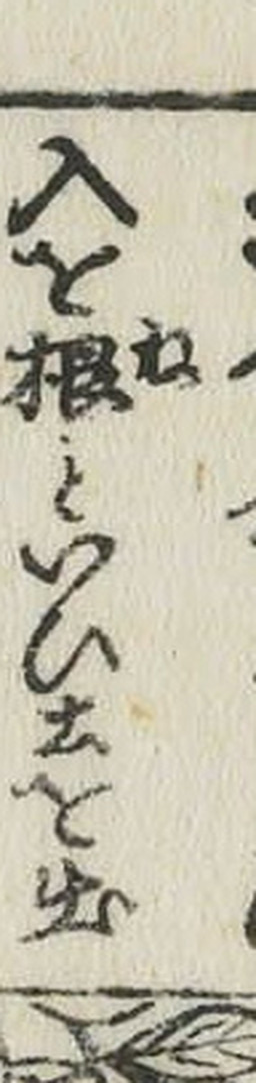入を根といひ土を出
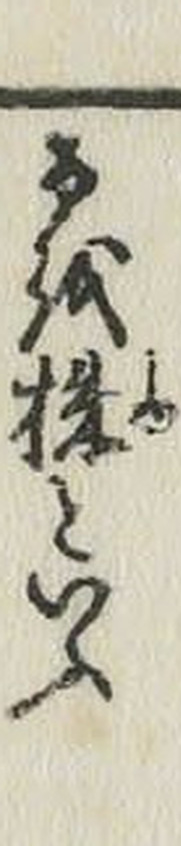るを株といふ
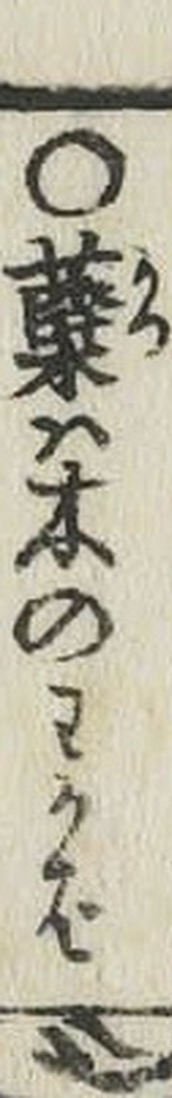○蘖は木のわかば
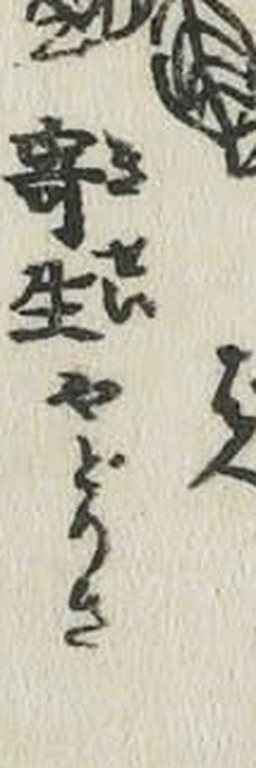寄生やどりき
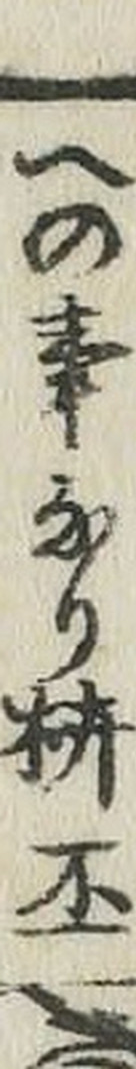への事なり枿丕
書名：増補頭書訓蒙図彙大成 10巻 8:巻之17-19
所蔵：東京学芸大学教育コンテンツアーカイブ
